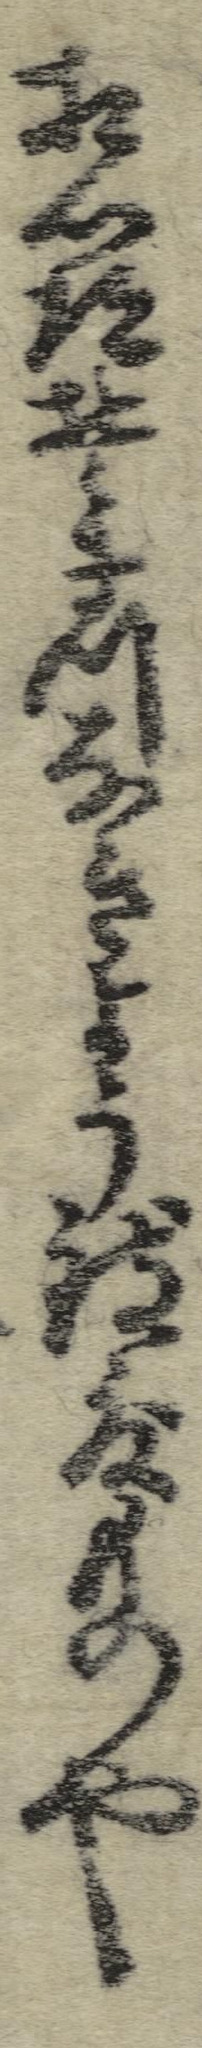相心得そまつなきよう致度もの也
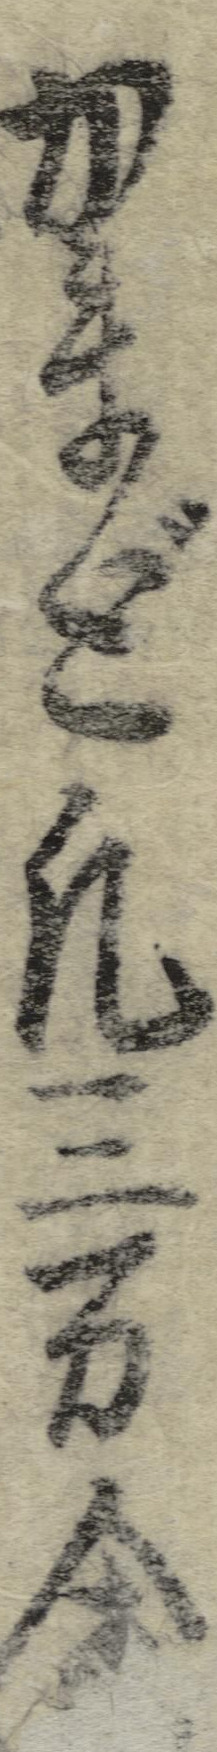かまど凡三万余
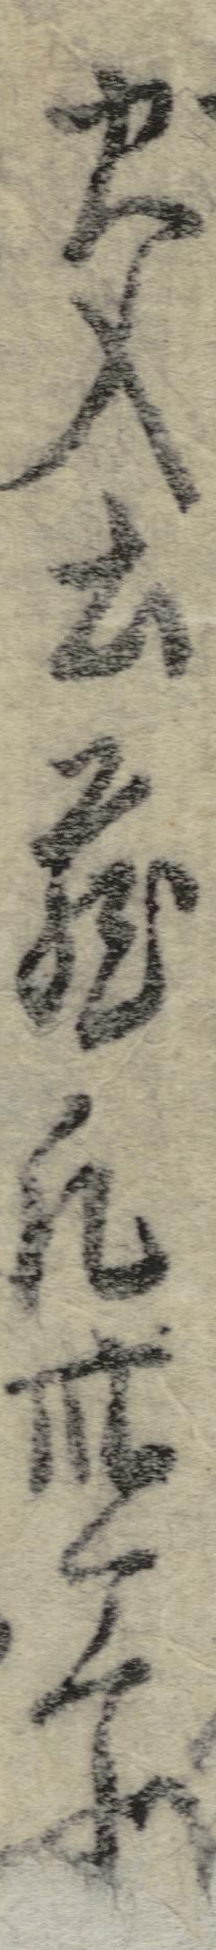火入土蔵凡三十ケ所
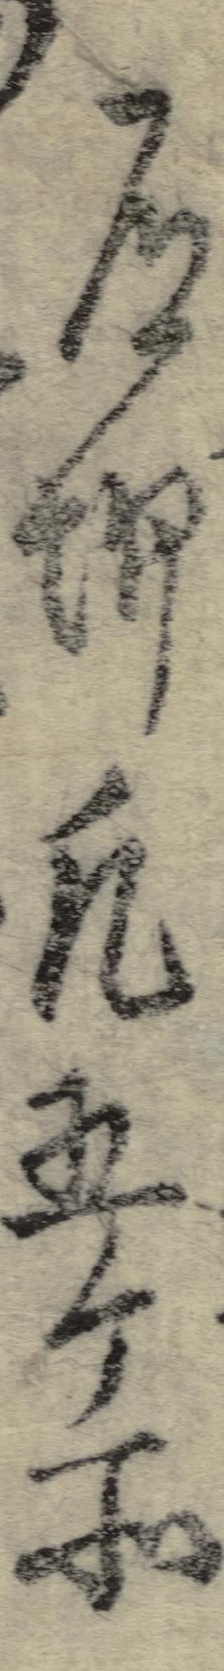道場凡五ケ所
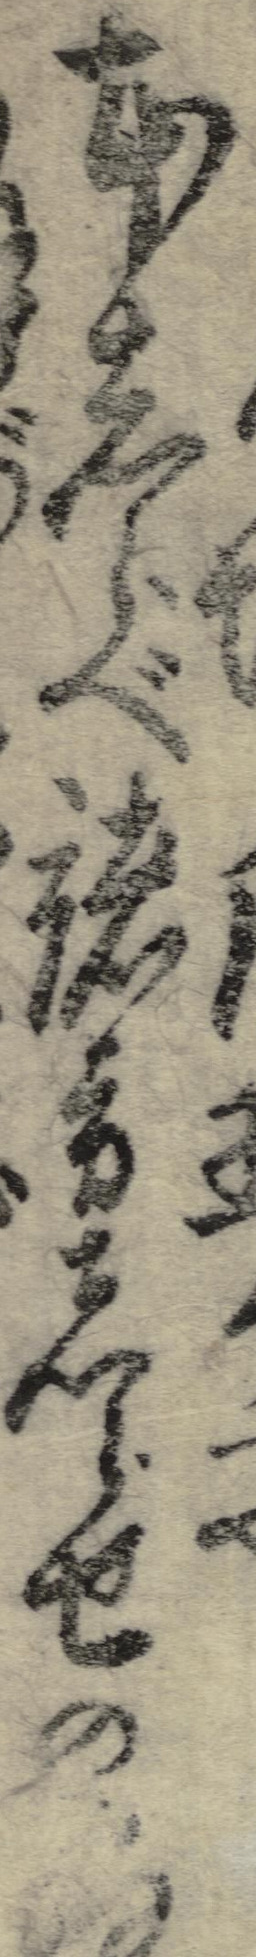本しらべ諸方しらせの為
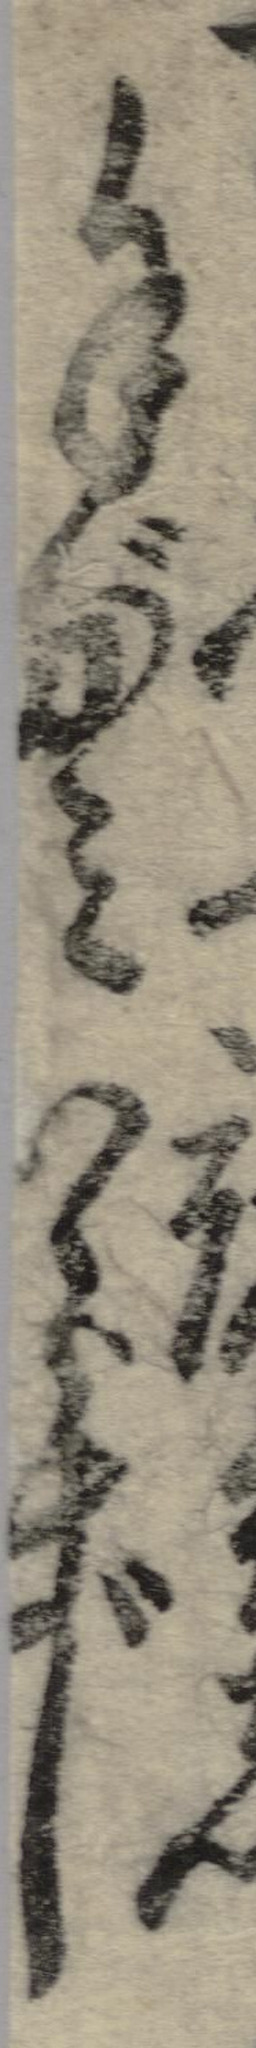手がミいらず
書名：大阪大火極細吟本しらべ
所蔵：東京大学地震研究所図書室 Earthquake Research Institute Library, The University of Tokyo, JAPAN
